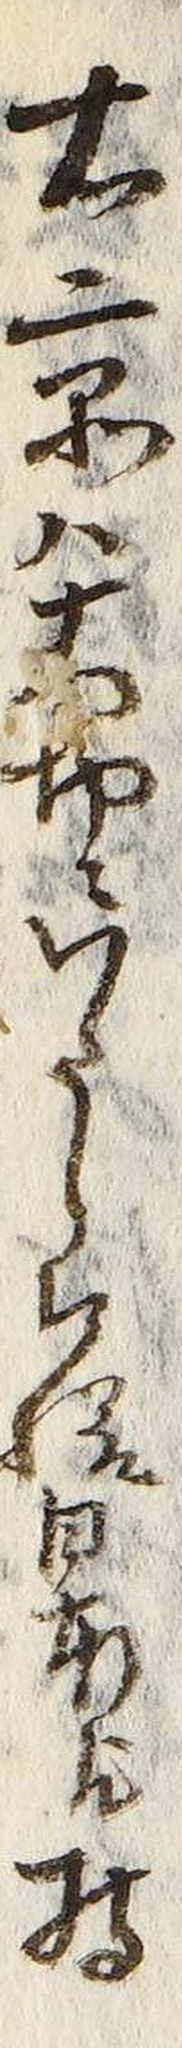右二品ハ大切ニいたし候様日本江持
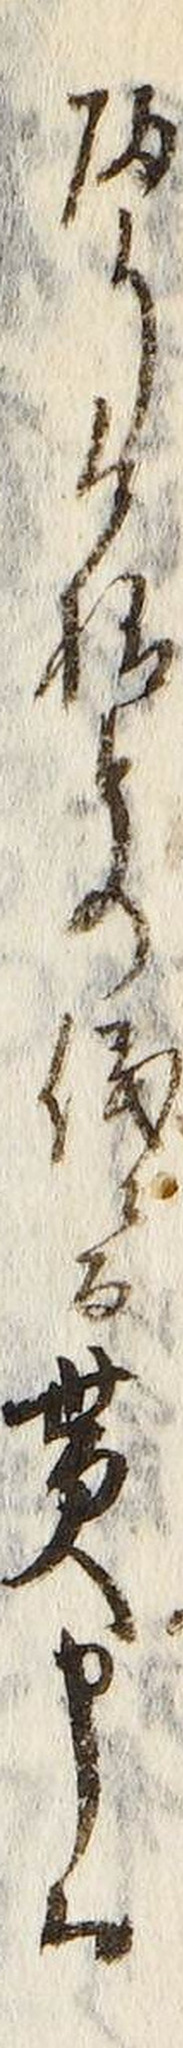帰り候様との儀ニ而貰申候
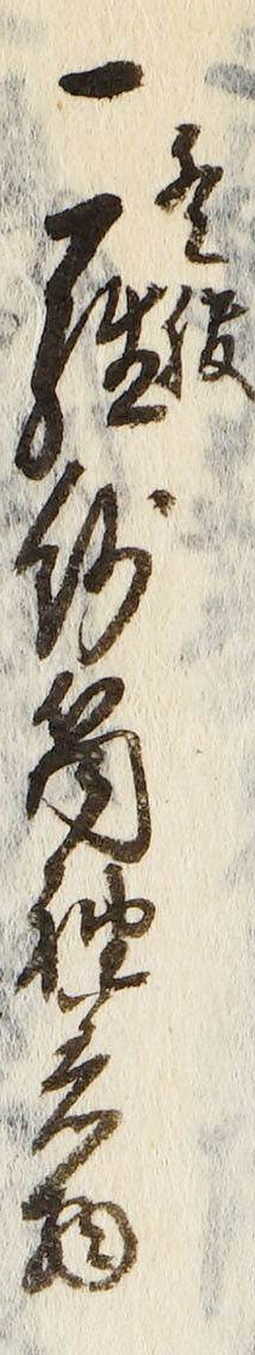羅紗筒袖着物壱
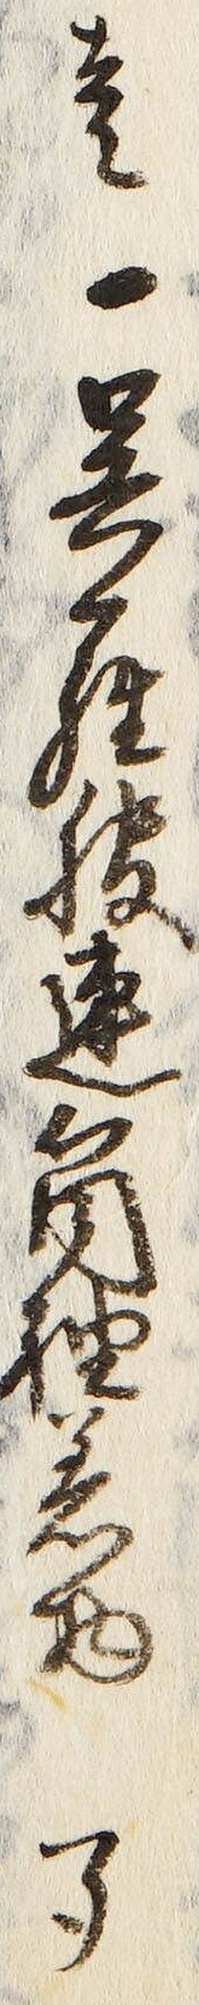一呉羅服連筒袖着物一ツ
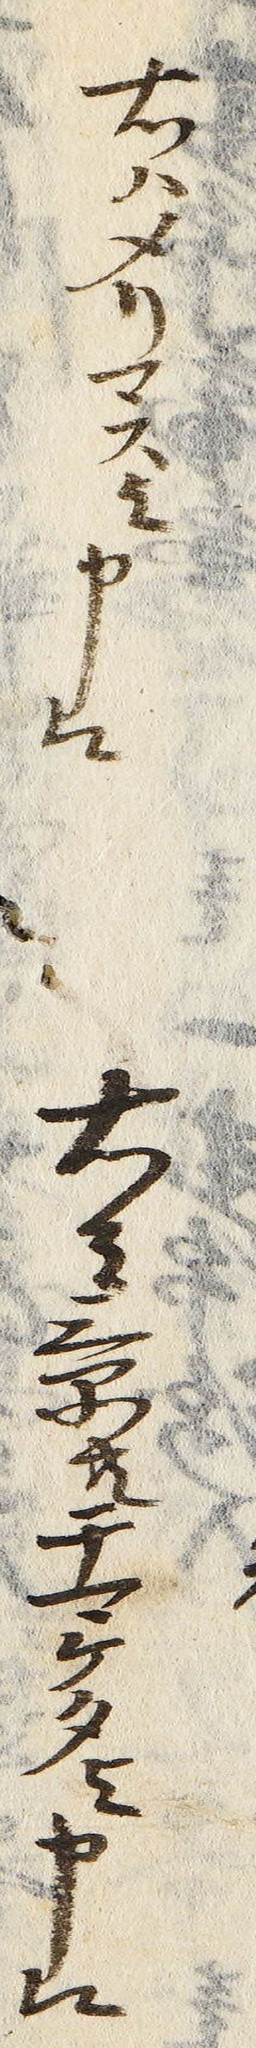右ハメリマスと申候
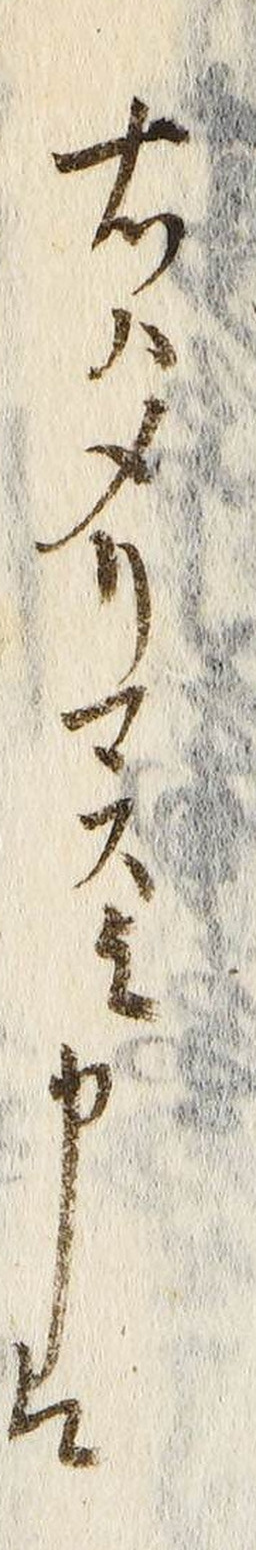右ハメリマスと申候
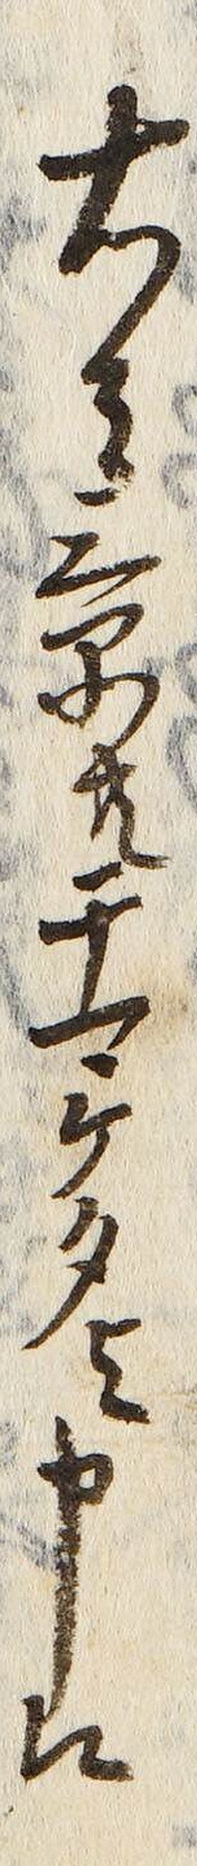右者三品共チマケタと申候
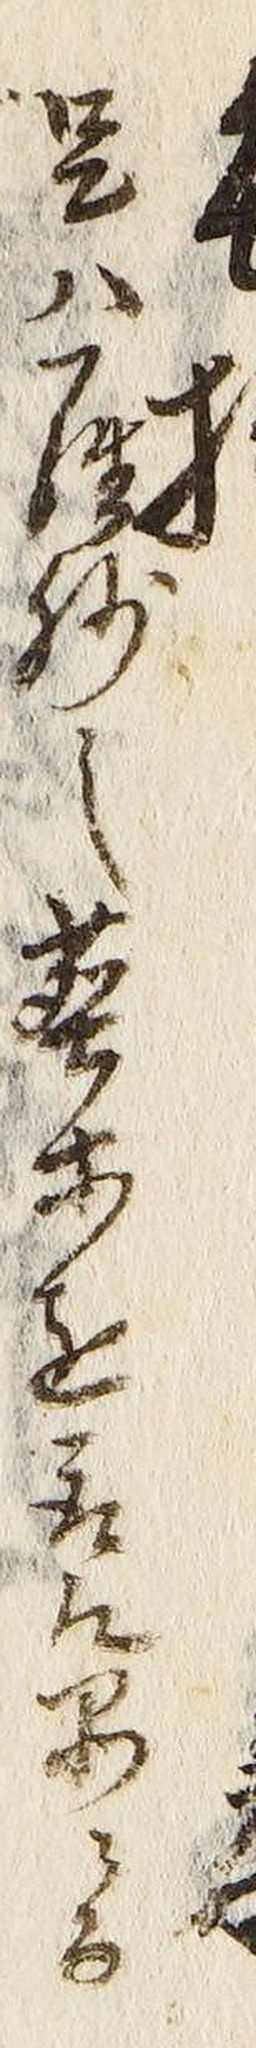是ハ羅紗之塵等を取候品ニ而
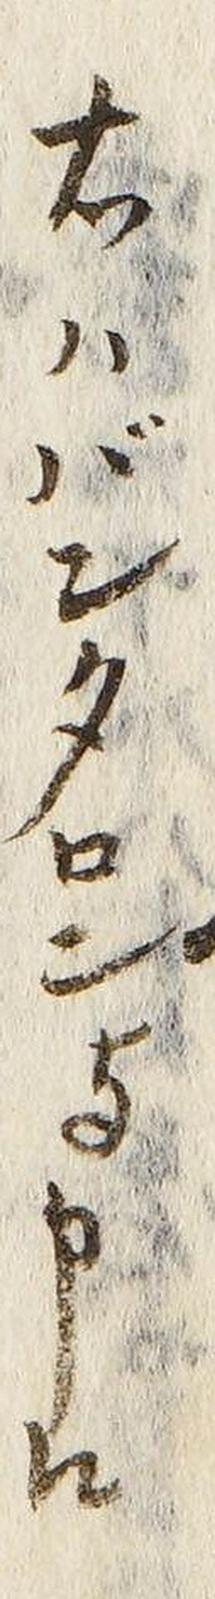右ハバンタロンと申候
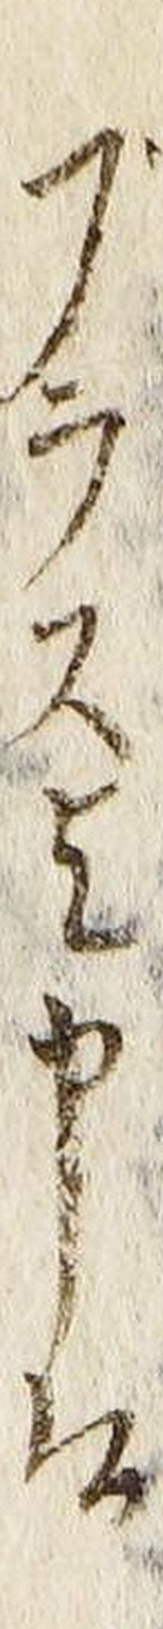ブラスと申候
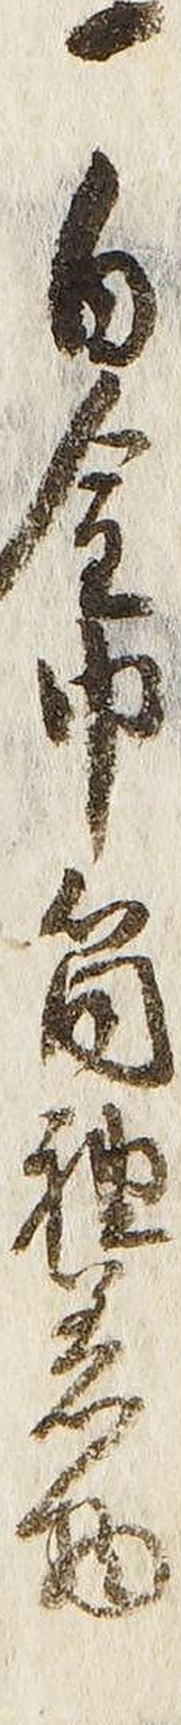一白金巾筒袖着物五
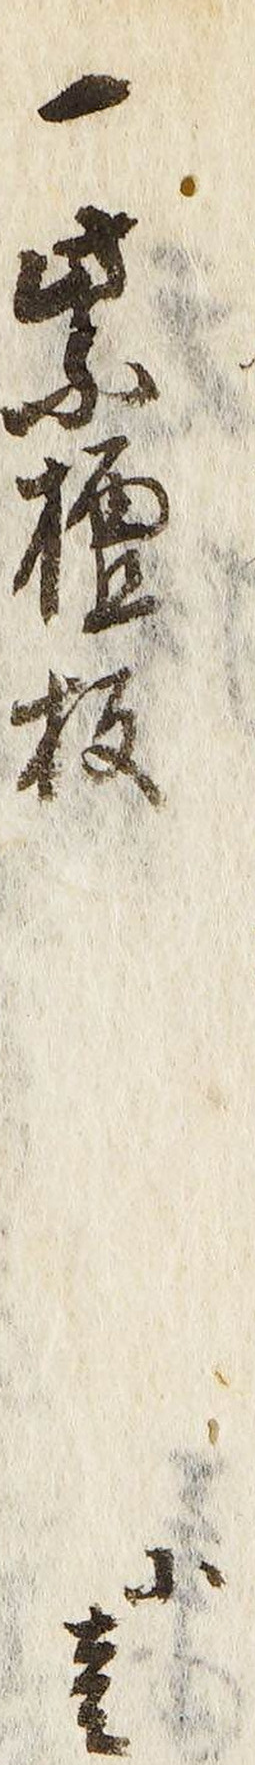一紫檀板小壱
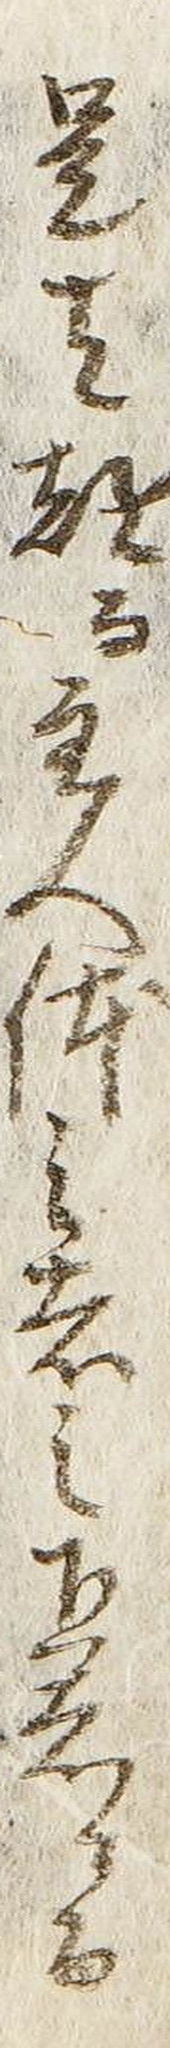是者都而主人体之者之下着ニ而
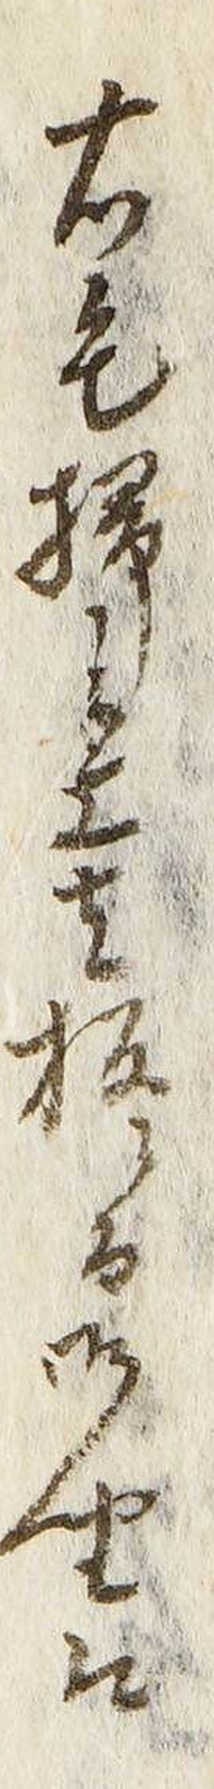右毛掃之上者板ニ而御座候
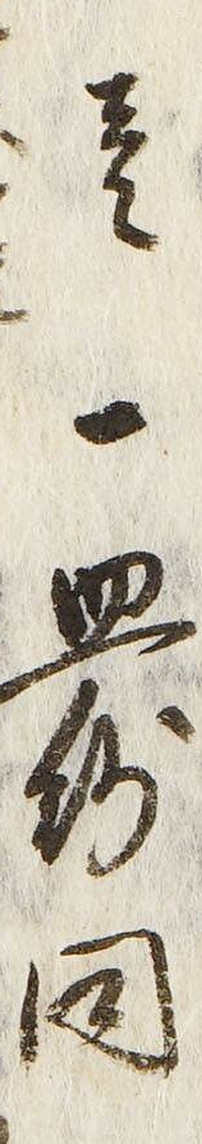一皿紗同壱
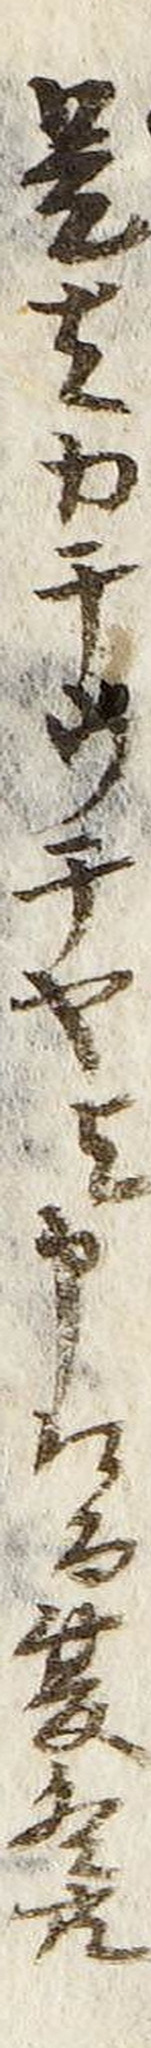是者カチウチヤと申候而夏冬共
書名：漂流人善助聞書
